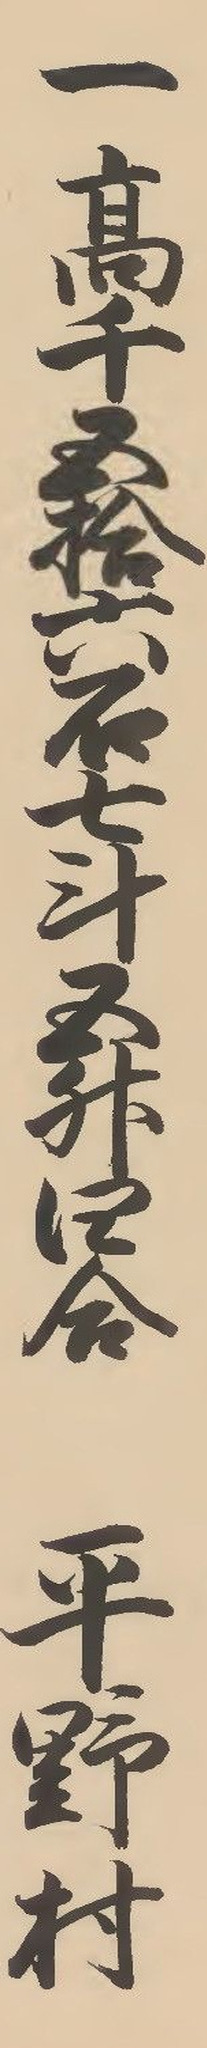一髙千五拾六石七斗五升四合平野村
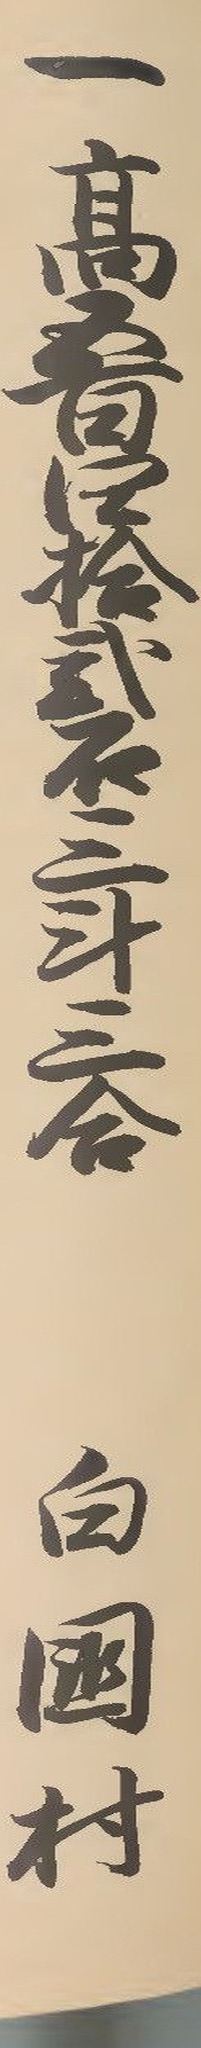一髙五百四拾弐石三斗三合白國村
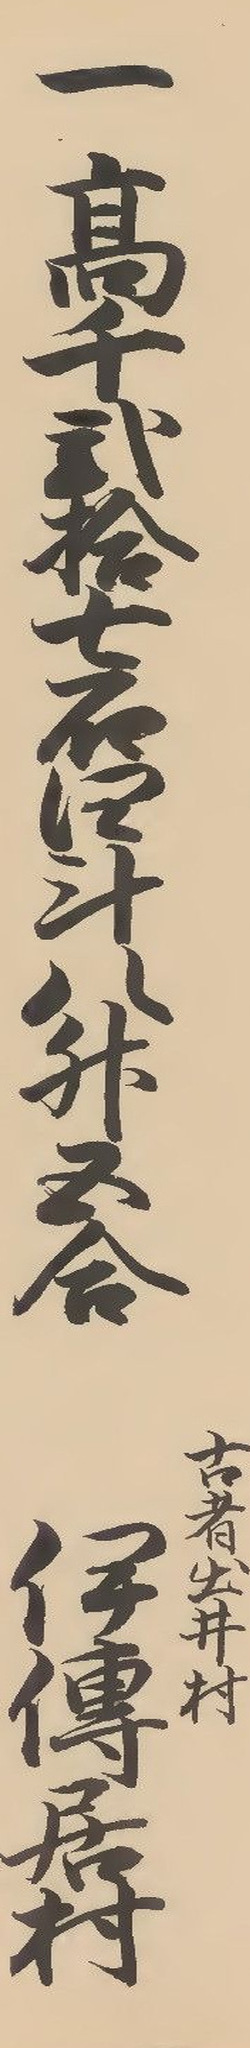一髙千弐拾七石四斗八升五合伊傳居村
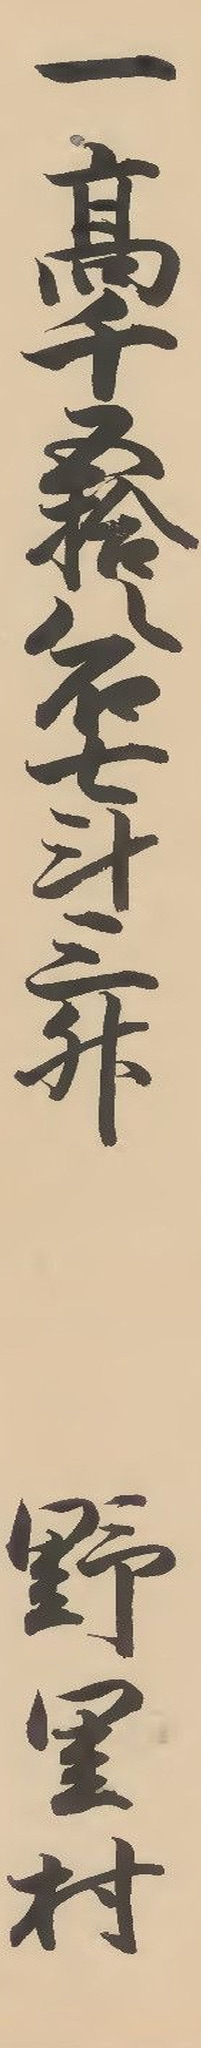一髙千五拾八石七斗三升野里村
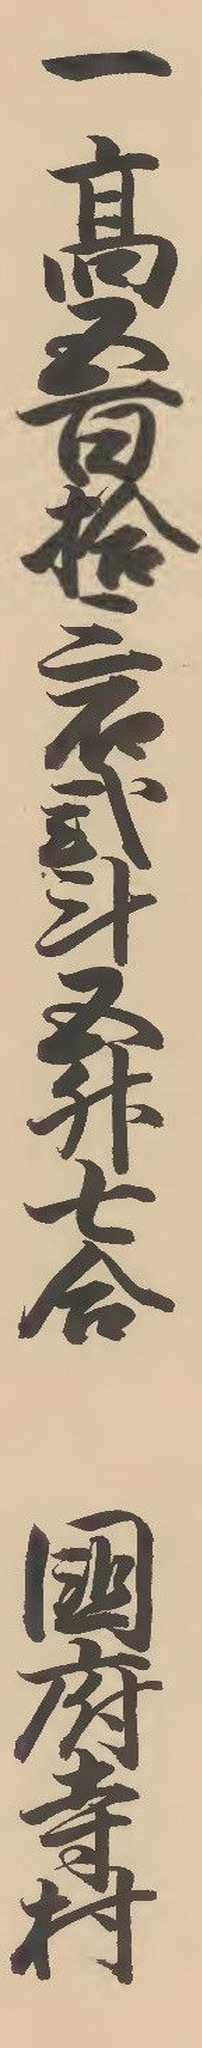一髙五百拾三石弐斗五升七合国府寺村

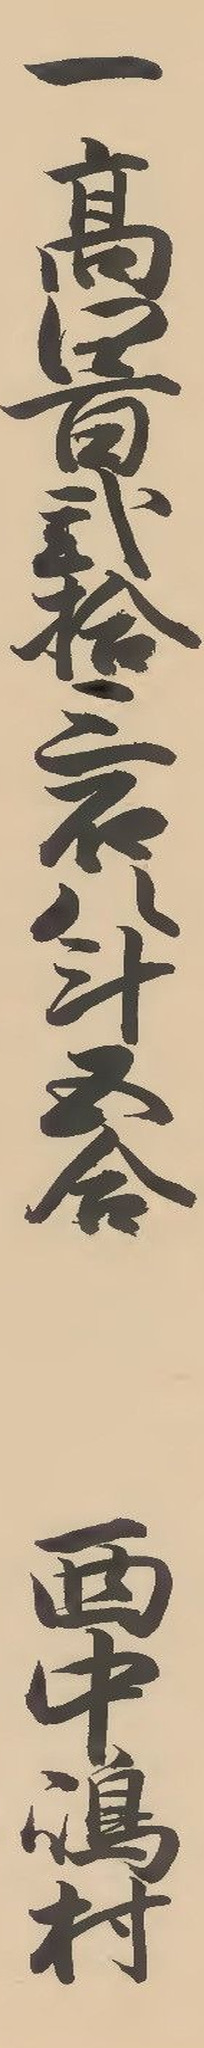一髙四百弐拾三石八斗五合西中嶋村
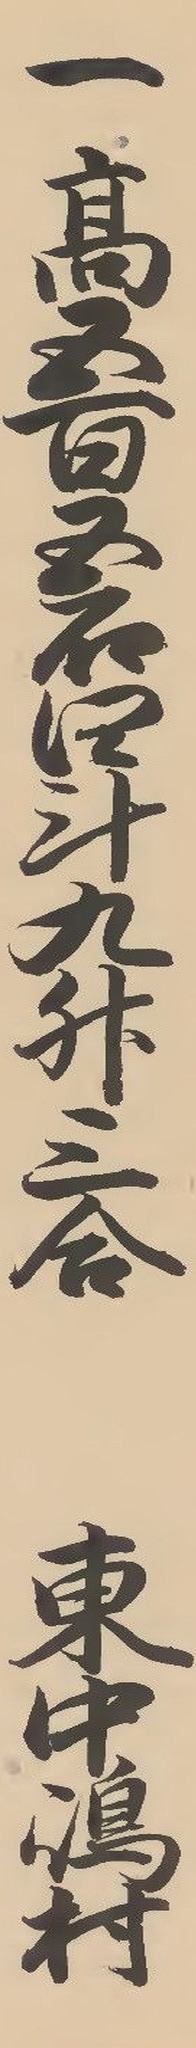一髙五百五石四斗九升三合東中嶋村
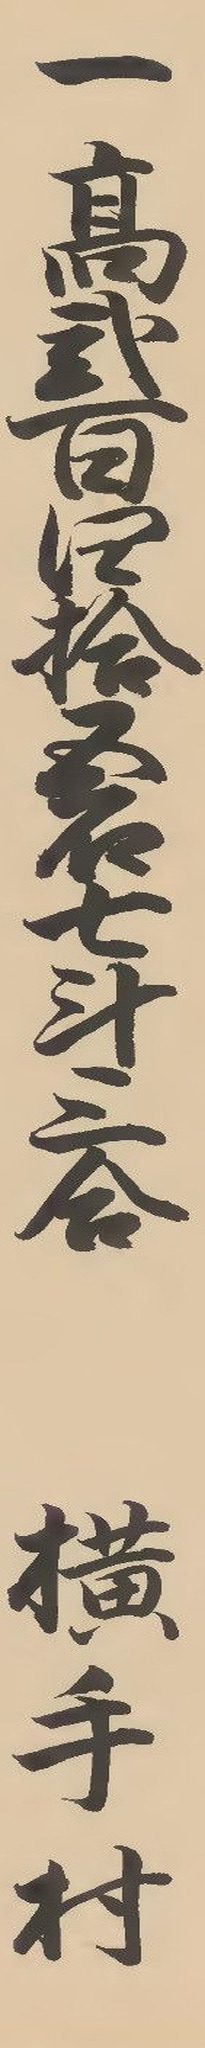一髙弐百四拾五石七斗三合横手村
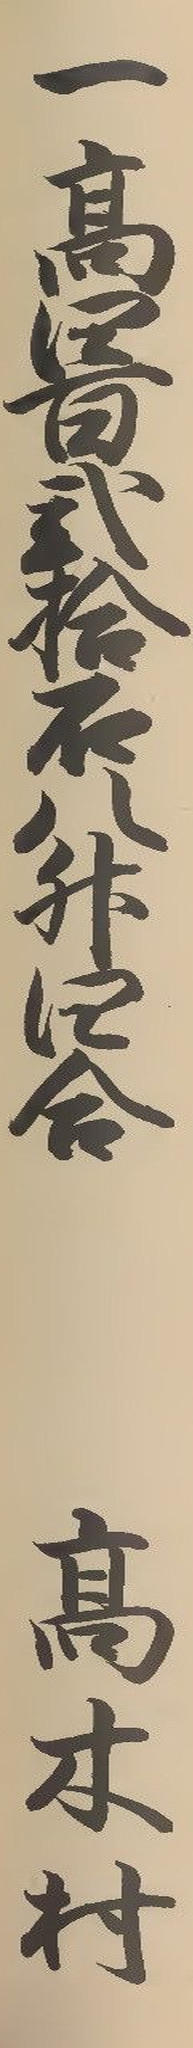一髙四百弐拾石八升四合髙木村
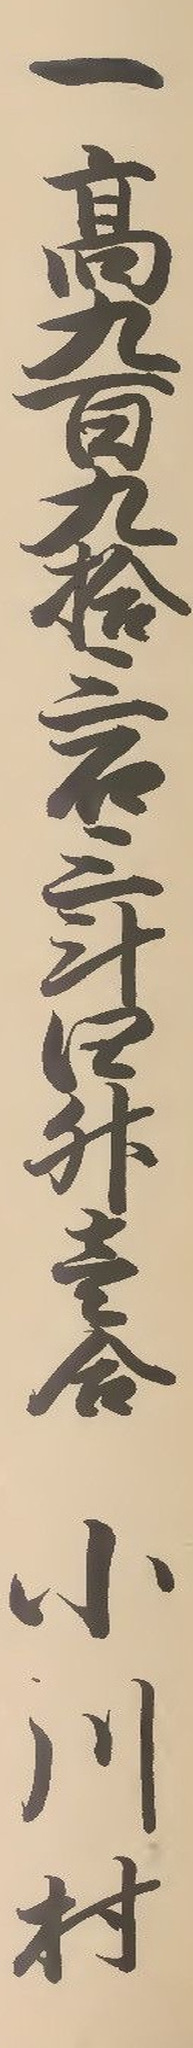一髙九百九拾三石三斗四升壱合小川村
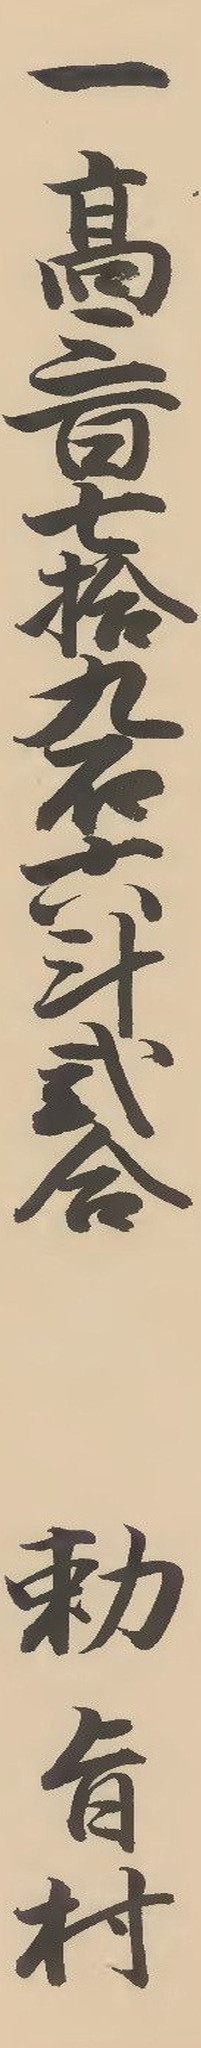一髙三百七拾九石六斗弐合勅旨村
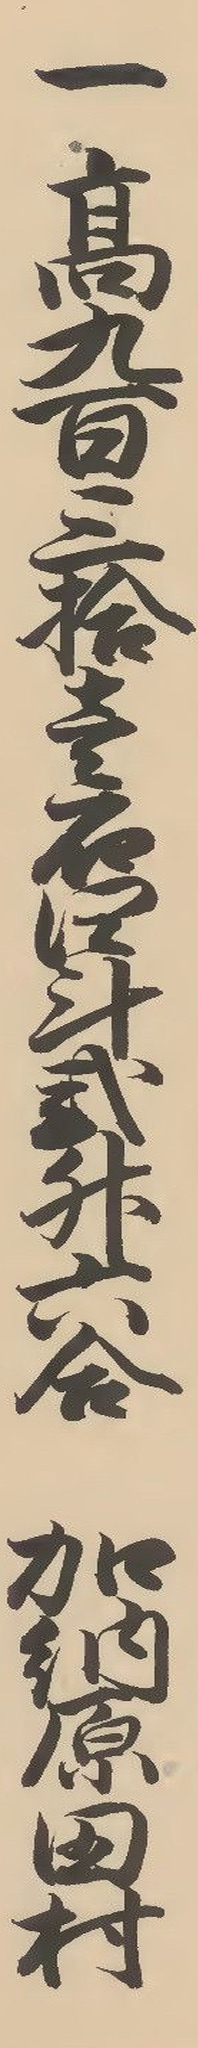一髙九百三拾壱石四斗弐升六合加納原田村
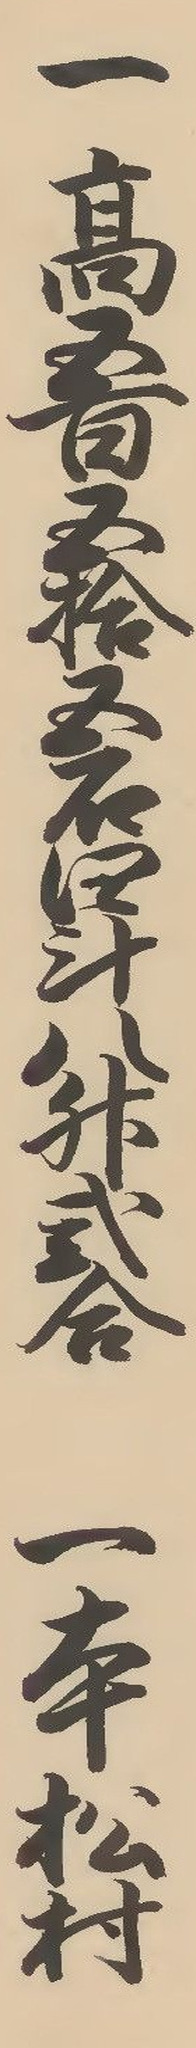一髙五百五拾五石四斗八升弐合一本松村

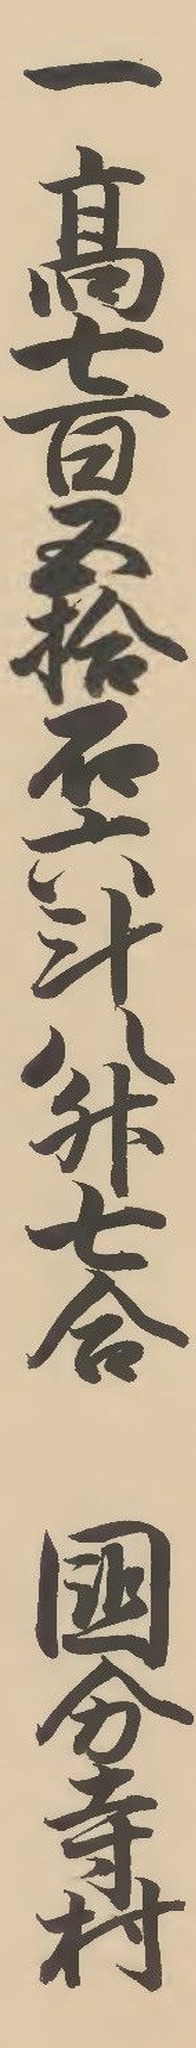一髙七百五拾石六斗八升七合国分寺村
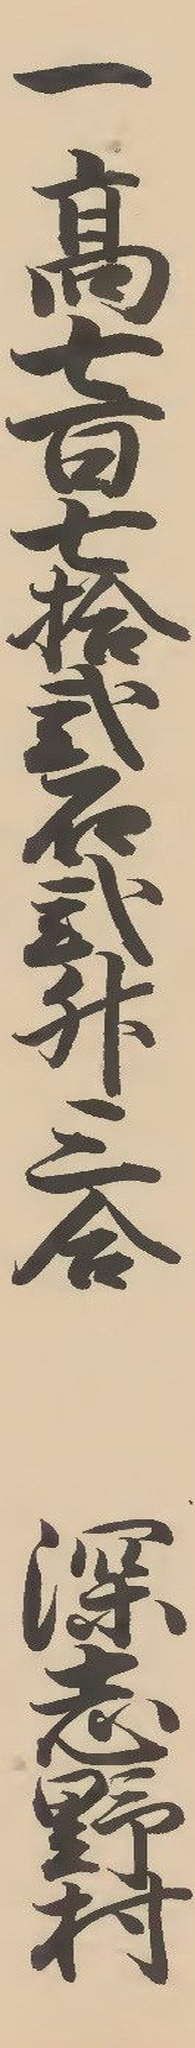一髙七百七拾弐石弐升三合深志野村
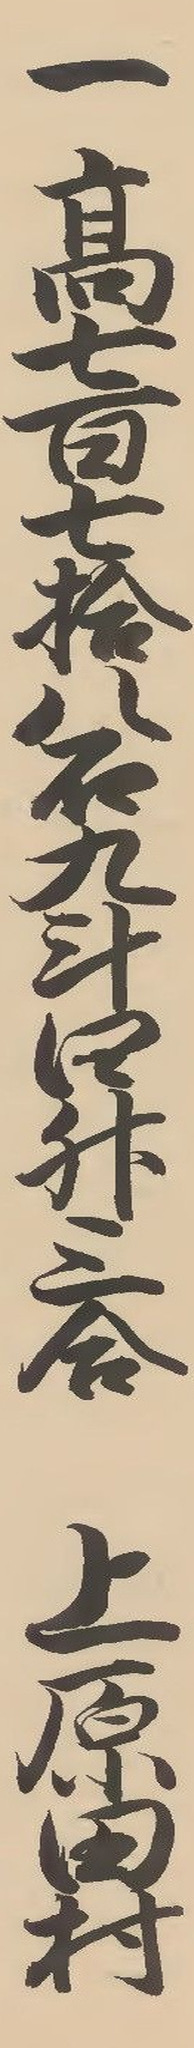一髙七百七拾八石九斗四升三合上原田村
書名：播磨国郷帳
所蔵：国立公文書館 National Archives of Japan
